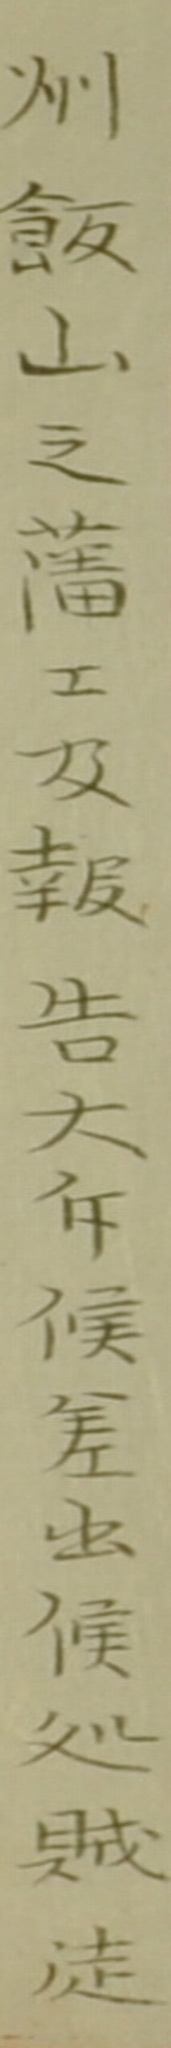州飯山之藩エ及報告大斥候差出候処賊徒
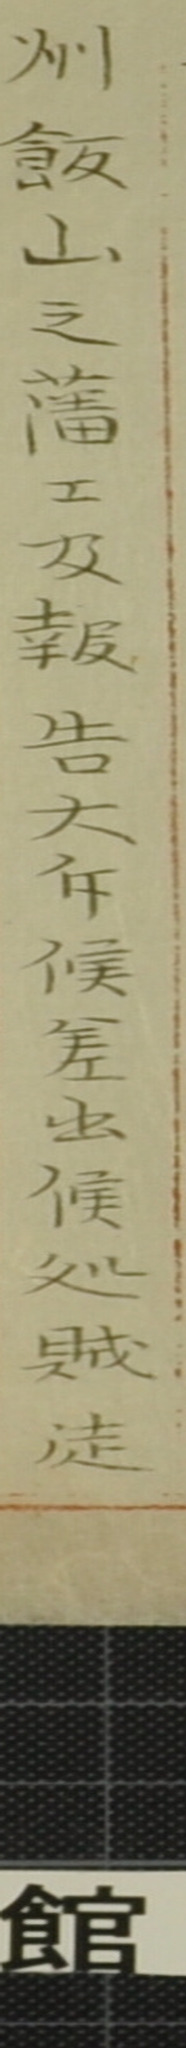州飯山之藩エ及報告大斥候差出候処賊徒
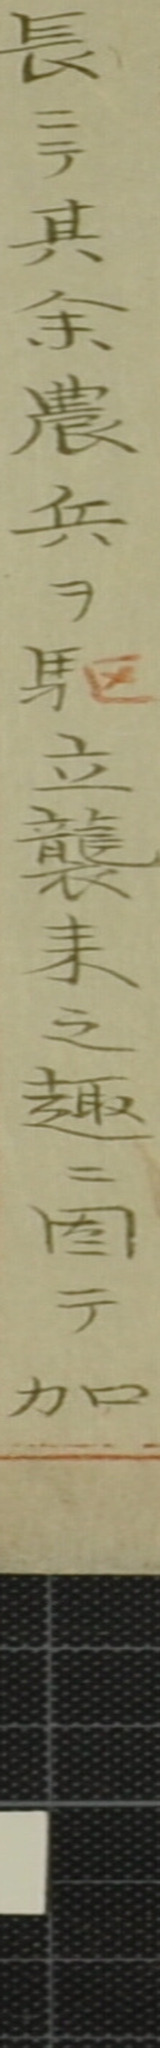長ニテ其余農兵をヲ駆立襲来之趣ニ因テ加
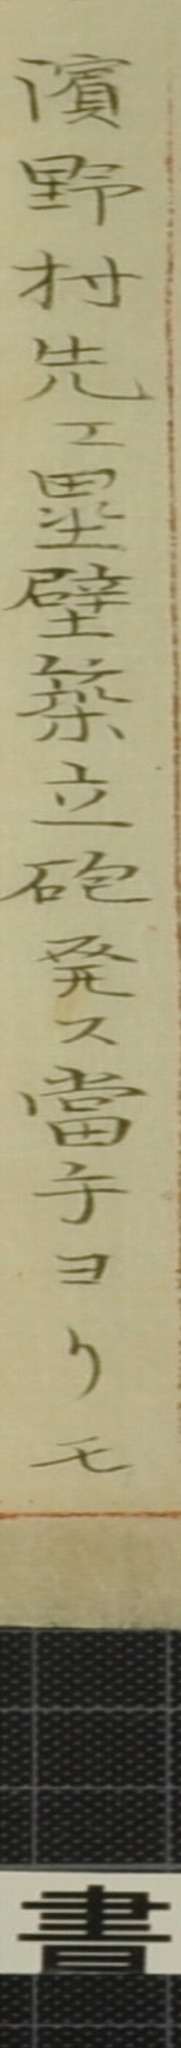浜野村先エ塁壁築立砲発ス当手ヨリモ

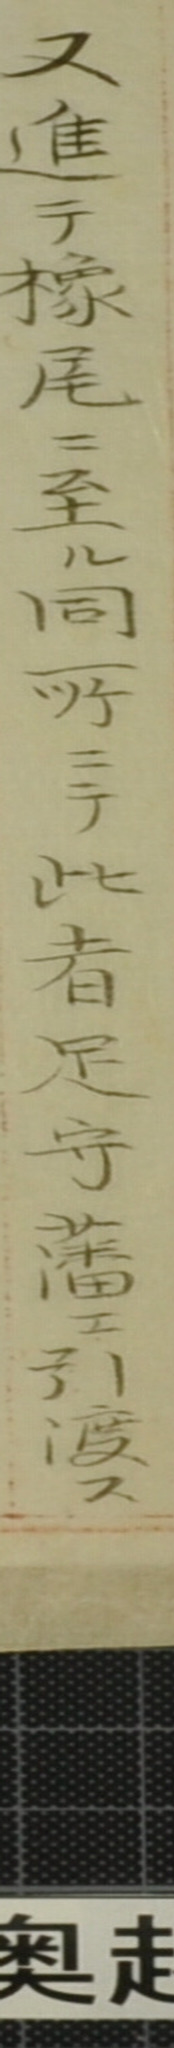又進テ橡尾ニ至ル同所ニテ此者足守藩エ引渡ス
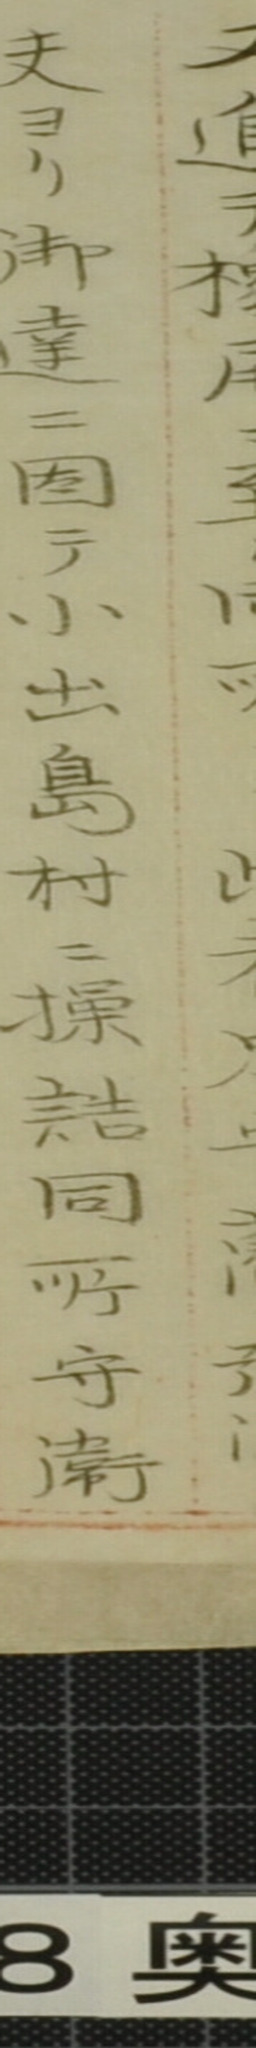夫ヨリ御達ニ因テ小出島村ニ操詰同所守衛
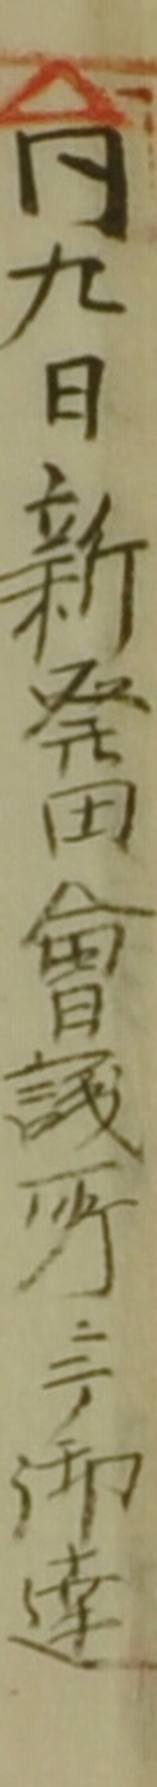「△同九日新発田会議所ニテ御達
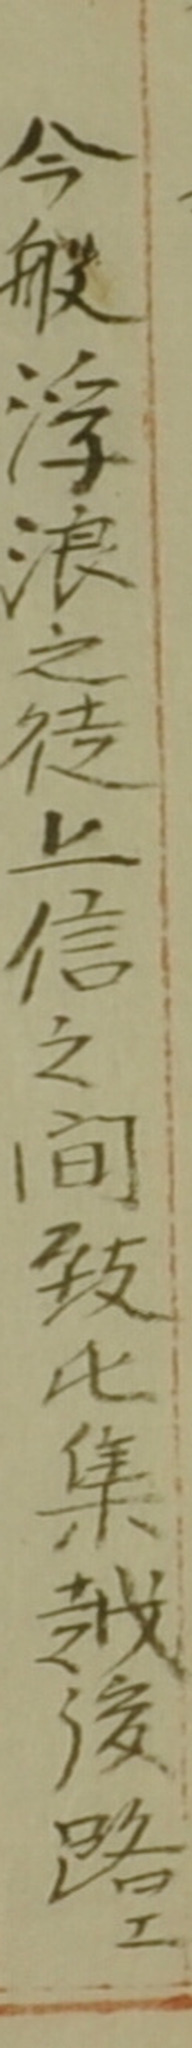別ヶ条今般浮浪之徒上信之間致此集越後路エ
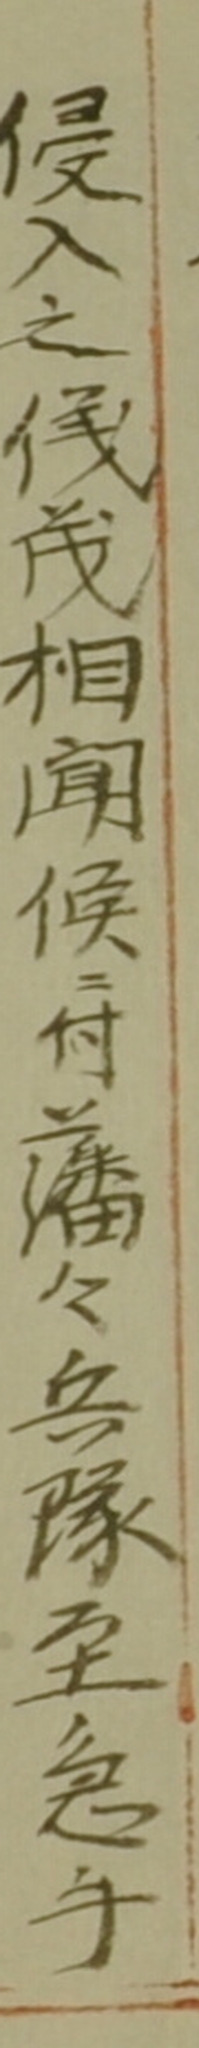侵入之賊茂相聞候ニ付藩々兵隊至急手
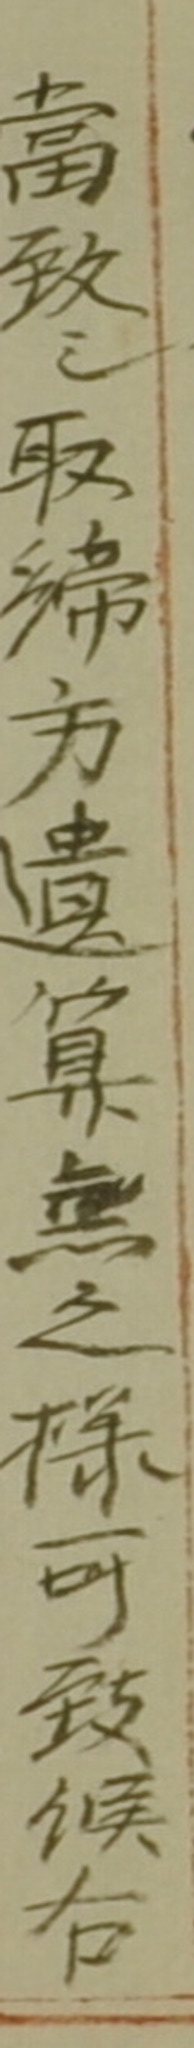当致シ取締方遺算無之様可致候右
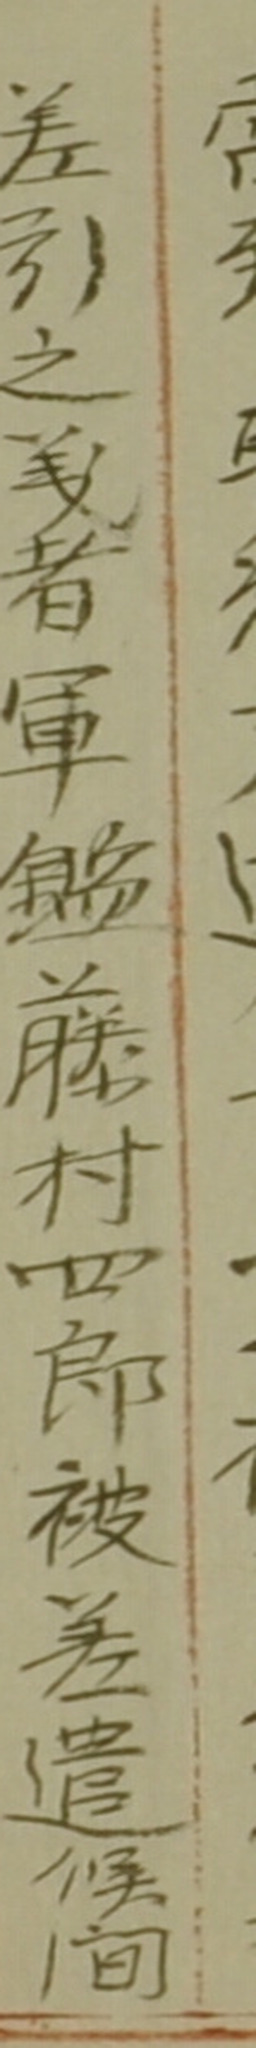差引之義者軍監藤村四郎被差遣候間
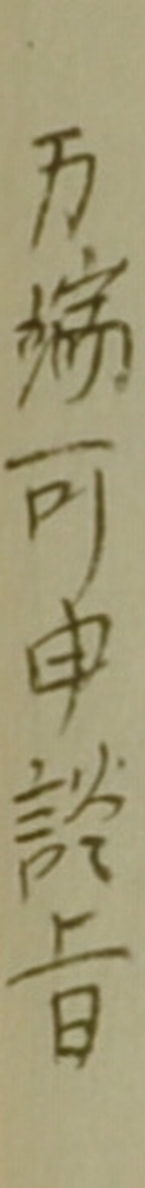万端可申談旨
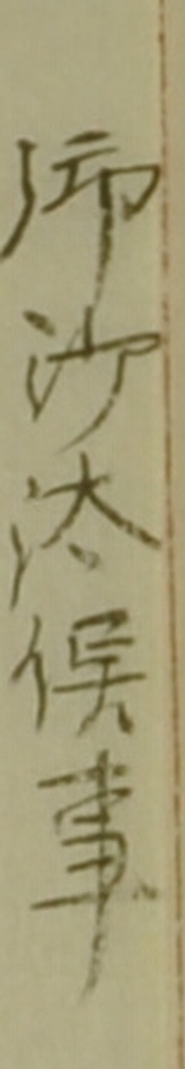御沙汰候事

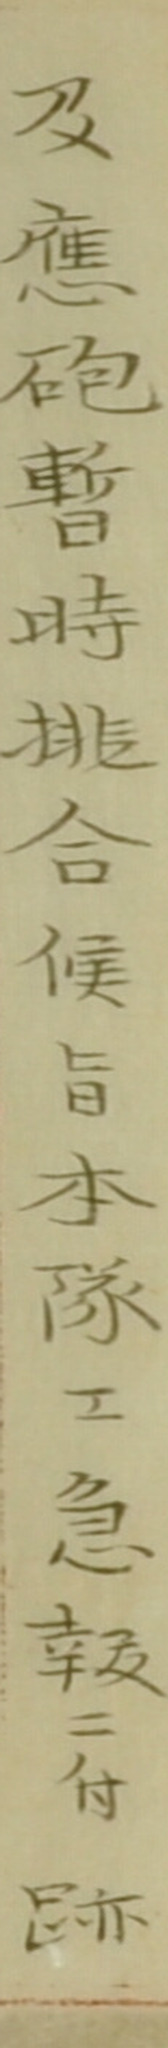及応砲暫時排合候旨本隊エ急報ニ付跡
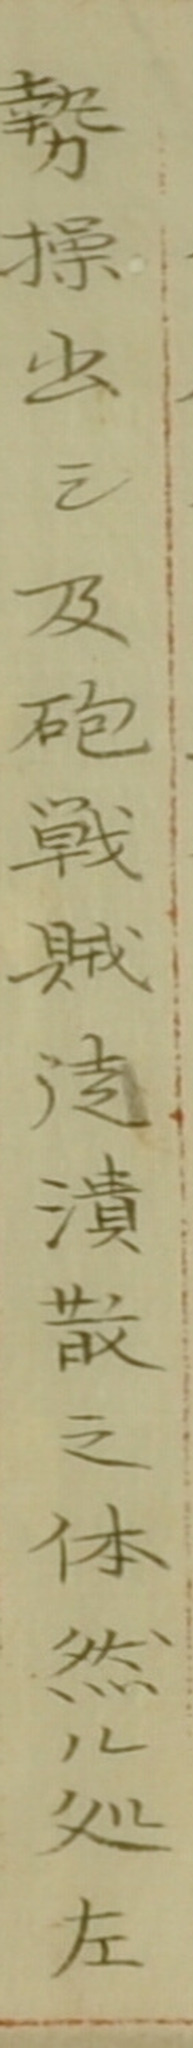勢操出シ及砲戦賊徒潰散之体然ル処左
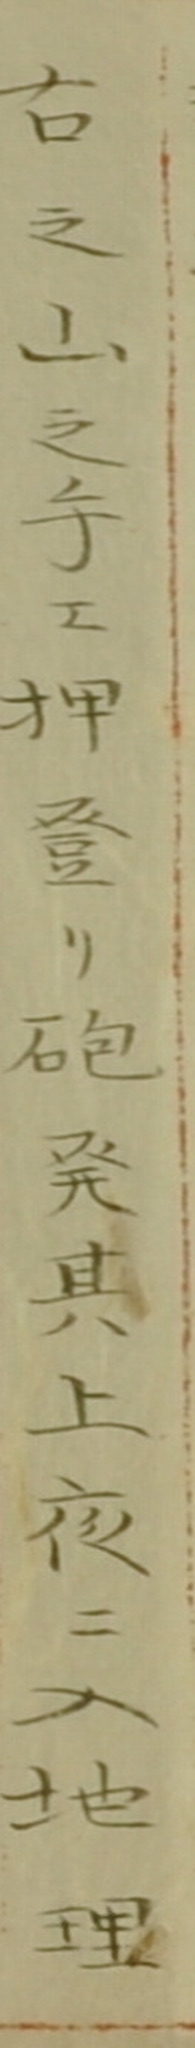右之山之手エ押登リ砲発其上夜ニ入地理
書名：奥越出兵中戦争之事件概略抄録（控）
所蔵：伊那市立高遠町図書館・合同会社AMANE
